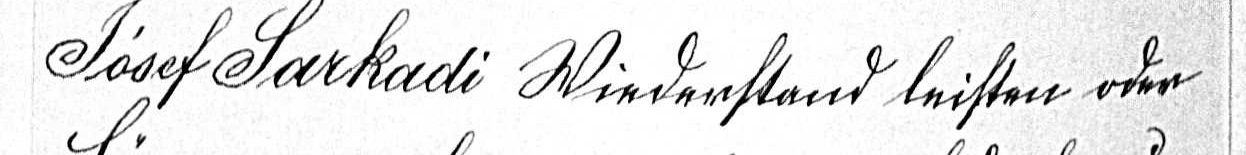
Jósef Sarkadi Wiederstand leisten oder
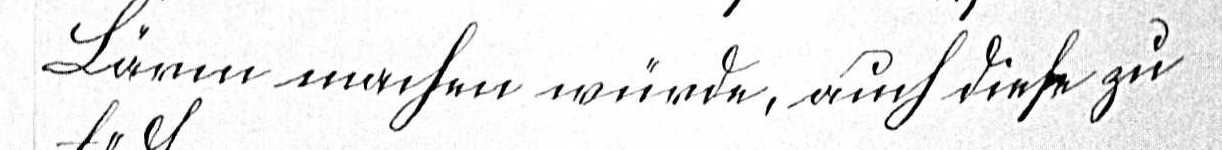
Lärm machen würde, auch diese zu
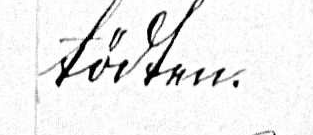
tödten.
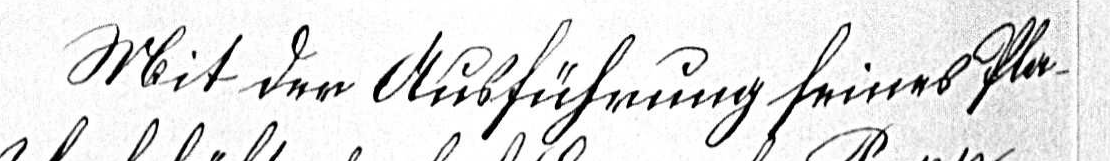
Mit der Ausführung seines Pla¬
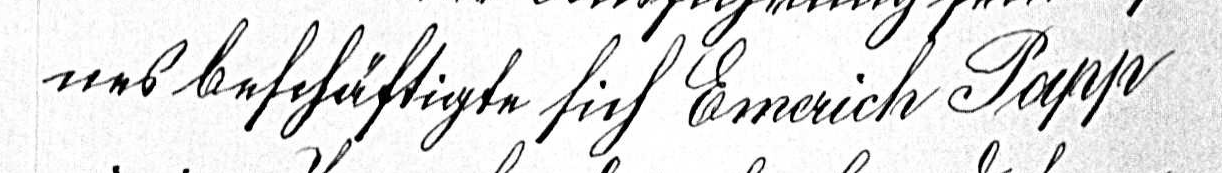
nes beschäftigte sich Emerich Papp
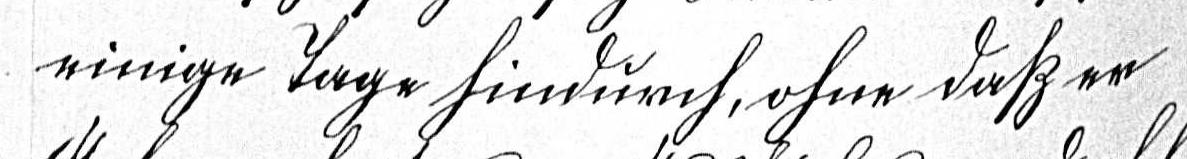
einige Tage hindurch, ohne daß er
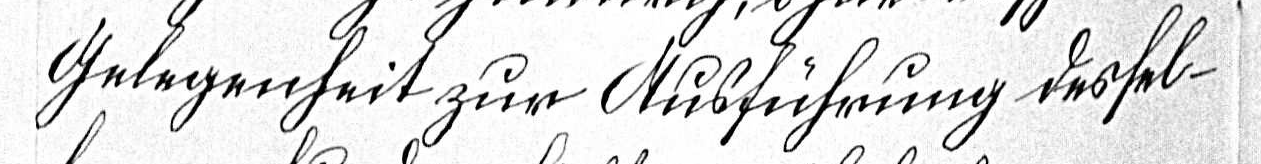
Gelegenheit zur Ausführung dessel¬
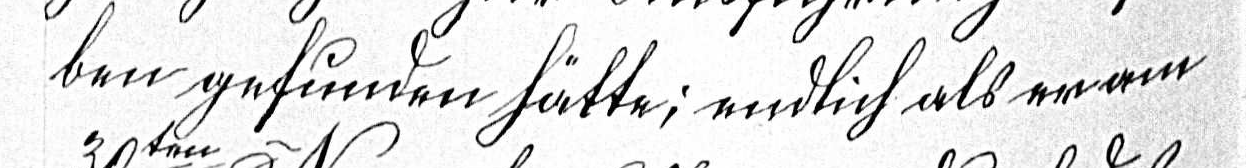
ben gefunden hätte; endlich als er am
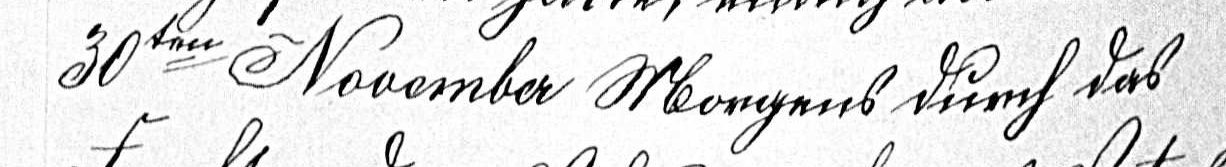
30ten November Morgens durch das
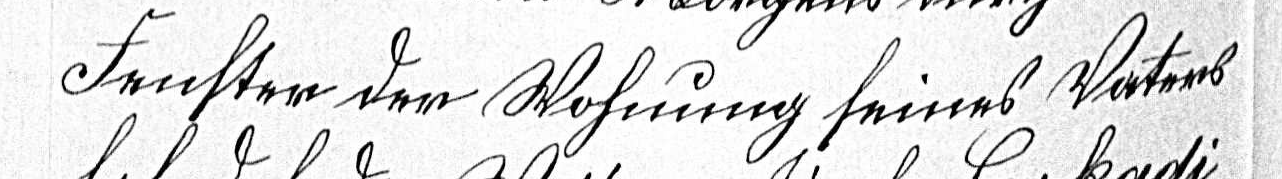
Fenster der Wohnung seines Vaters
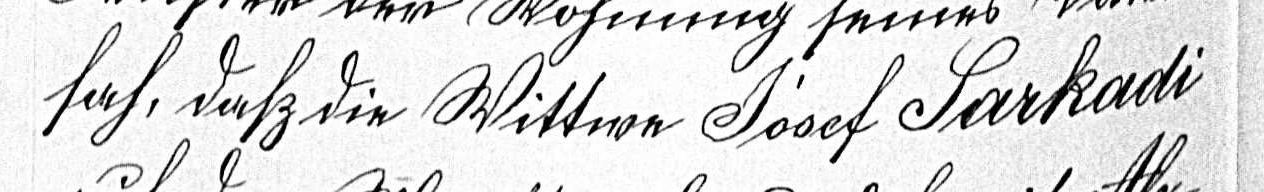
sah, daß die Wittwe Jósef Sarkadi
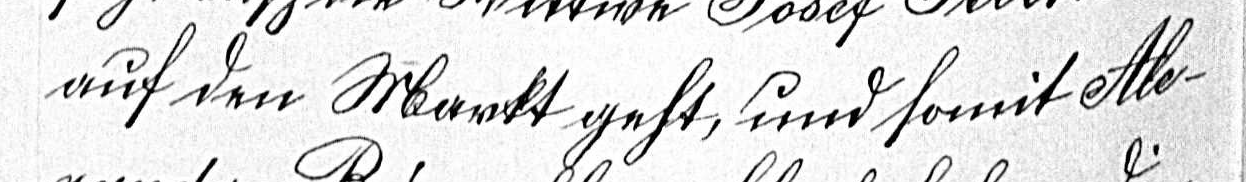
auf den Markt geht, und somit Ale¬
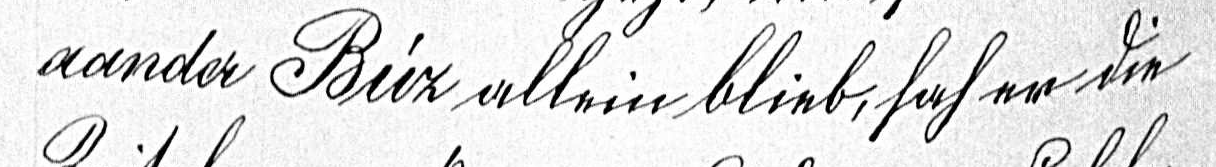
xander Búz allein blieb, sah er die
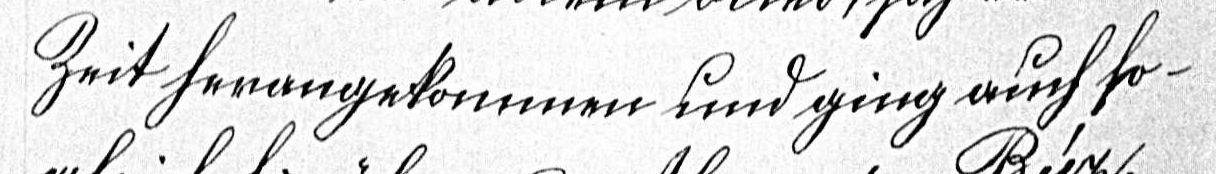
Zeit herangekommen und ging auch so¬
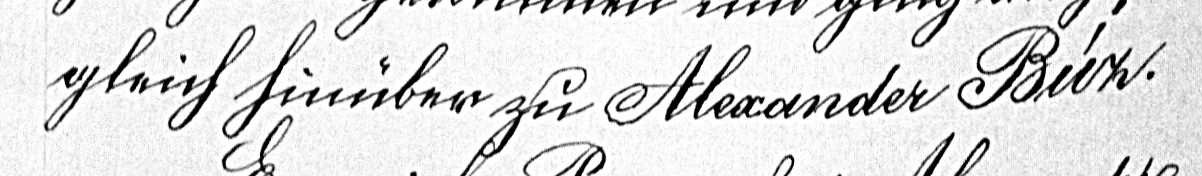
gleich hinüber zu Alexander Búz.
